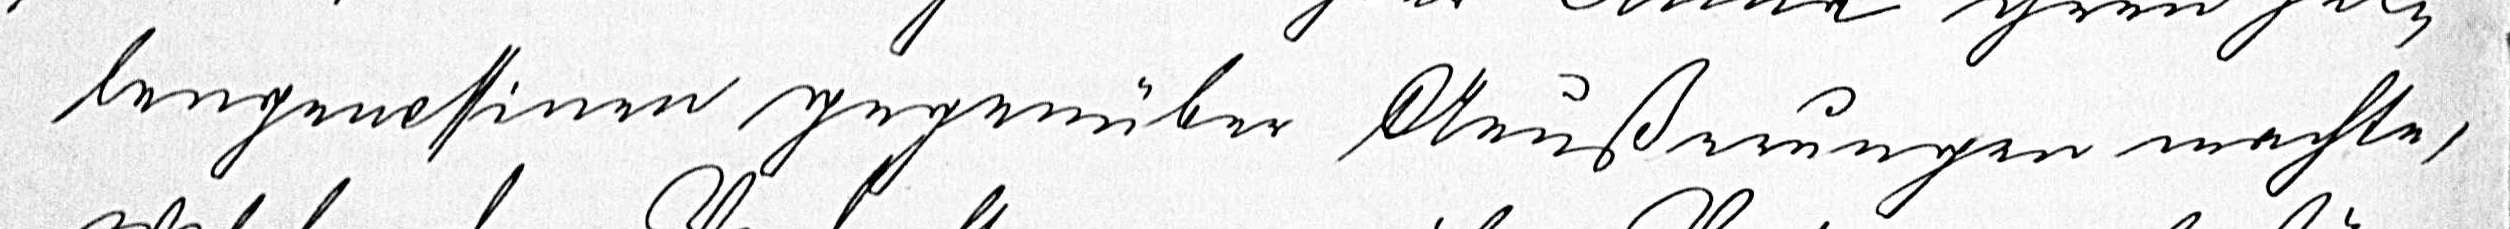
lengenossinen gegenüber Aeußerungen machte,
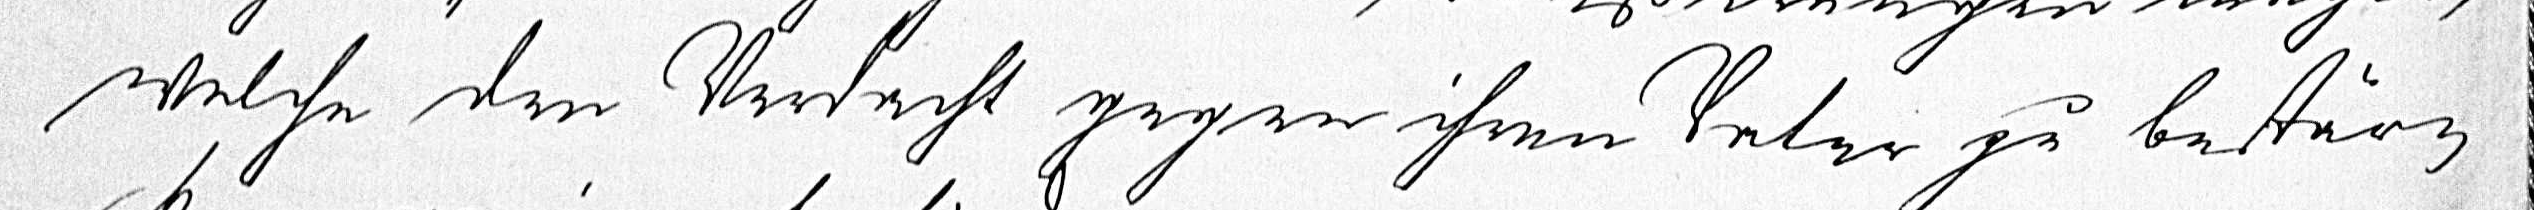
welche den Verdacht gegen ihren Vater zu bestär¬
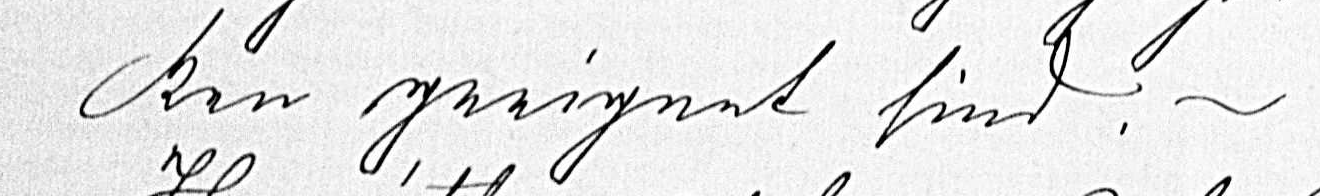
ken geeignet sind.
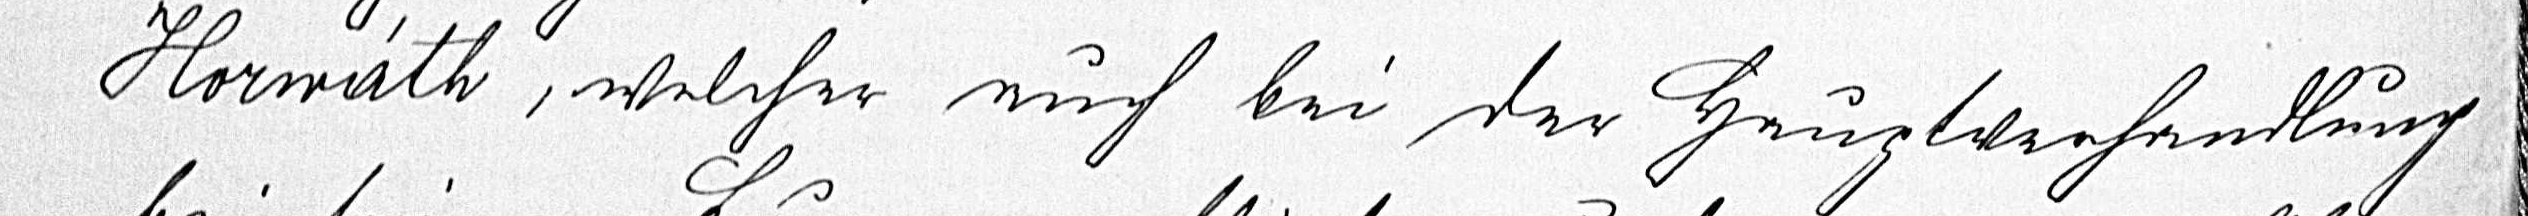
Horwáth, welcher auch bei der Hauptverhandlung
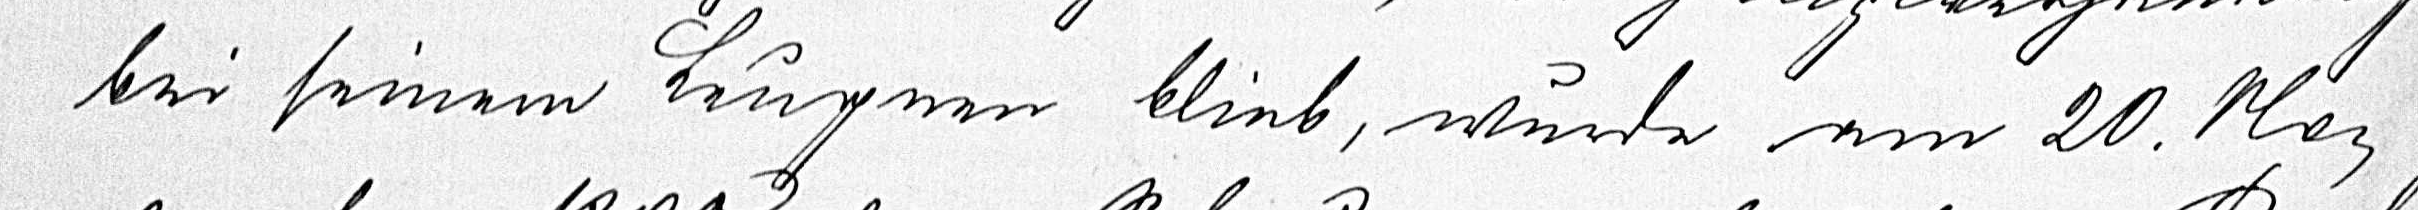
bei seinem Leugnen blieb, wurde am 20. No¬
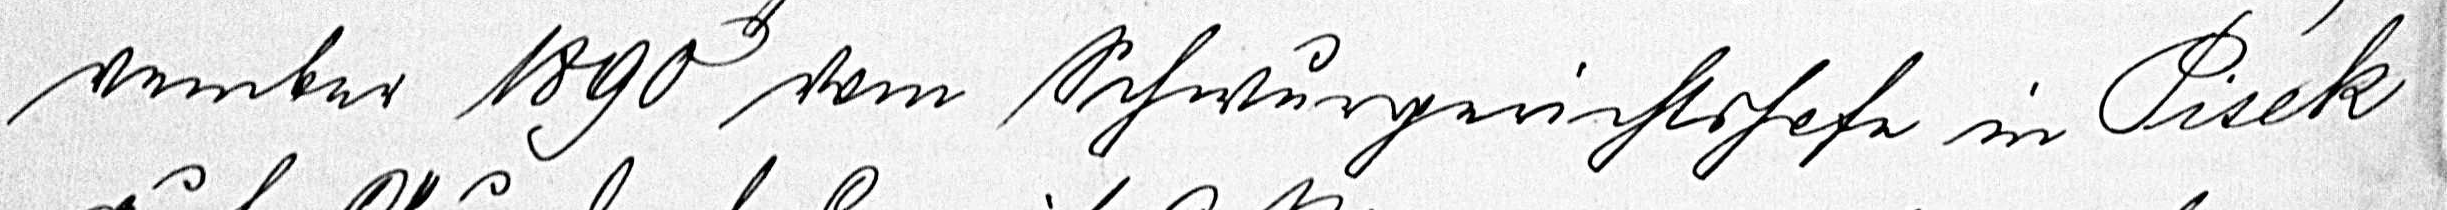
vember 1890 vom Schwurgerichtshofe in Pisek
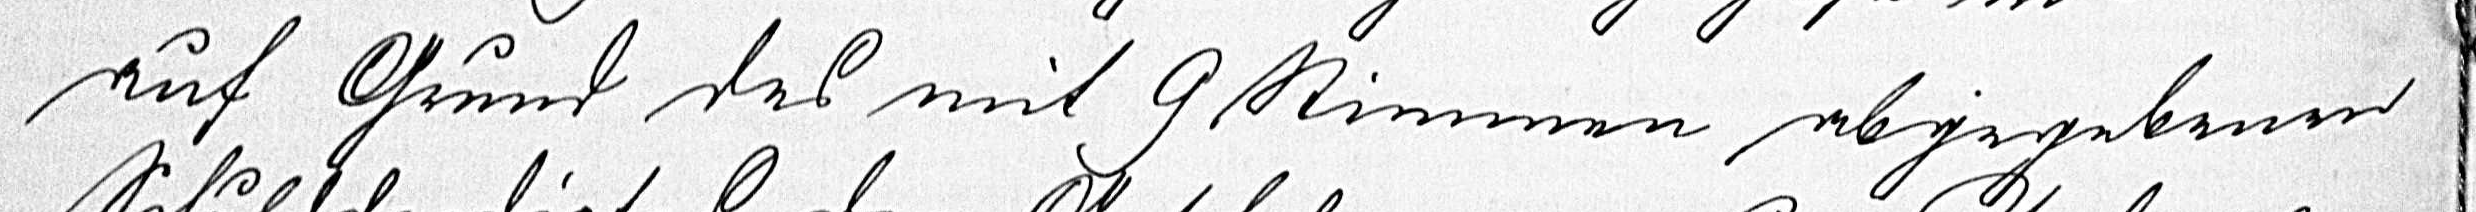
auf Grund des mit 9 Stimmen abgegebenen
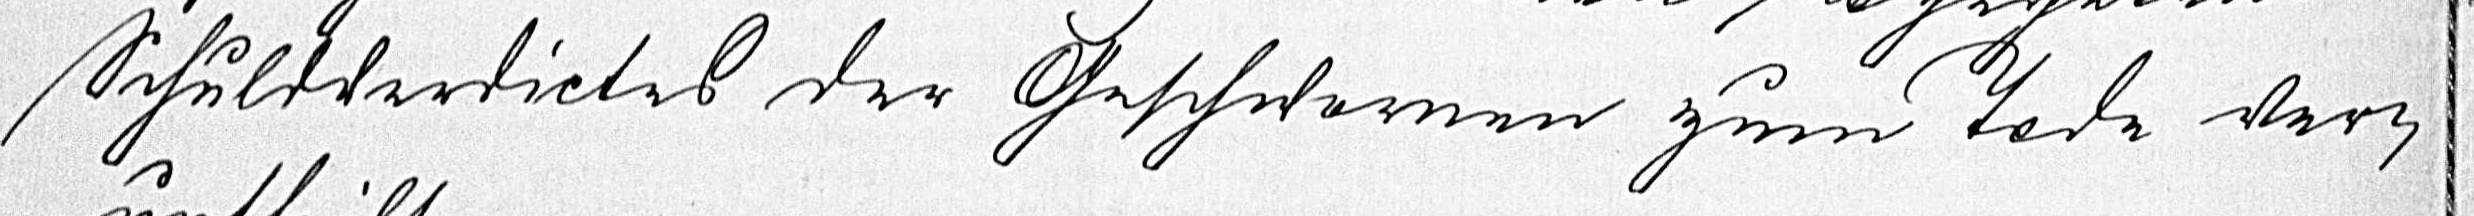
Schuldverdictes der Geschwornen zum Tode ver¬
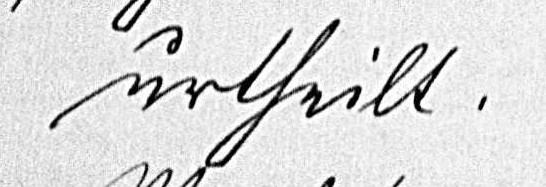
urtheilt.
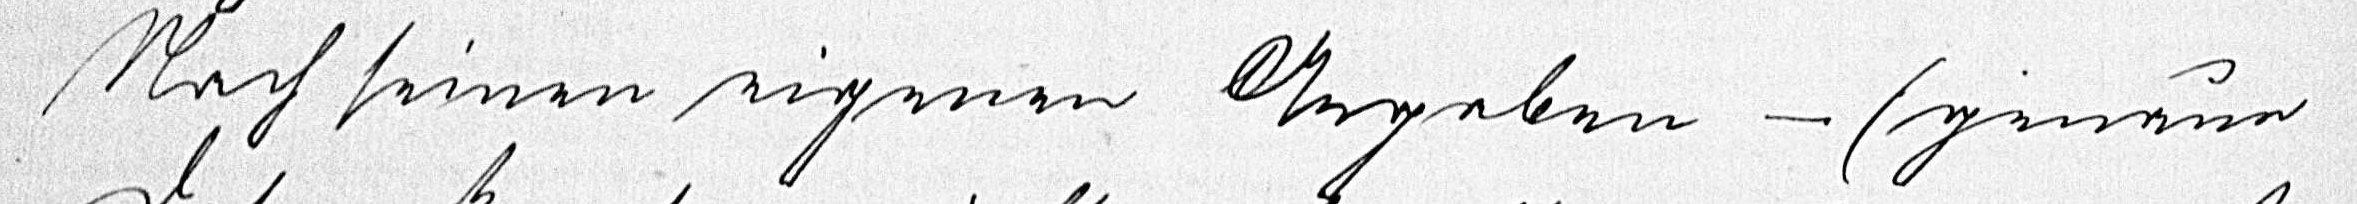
Nach seinen eigenen Angaben – (genaue
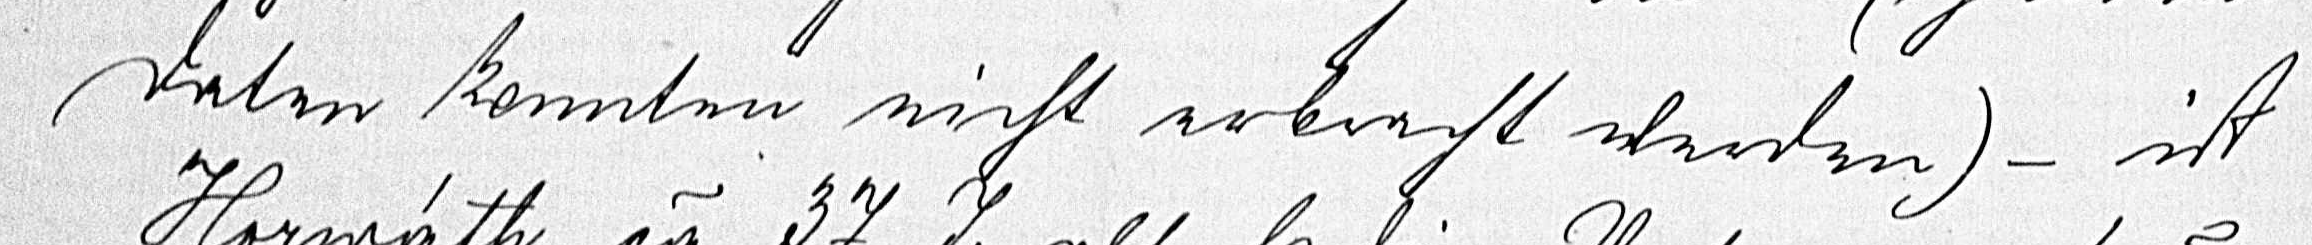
Daten konnten nicht erbracht werden) – ist
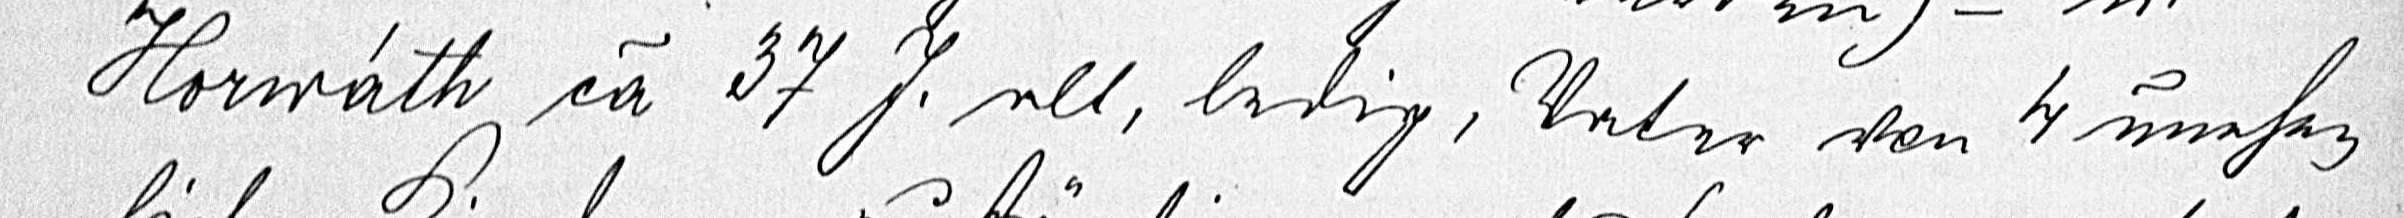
Horwáth ca 37 J. alt, ledig, ater von 4 unehe¬
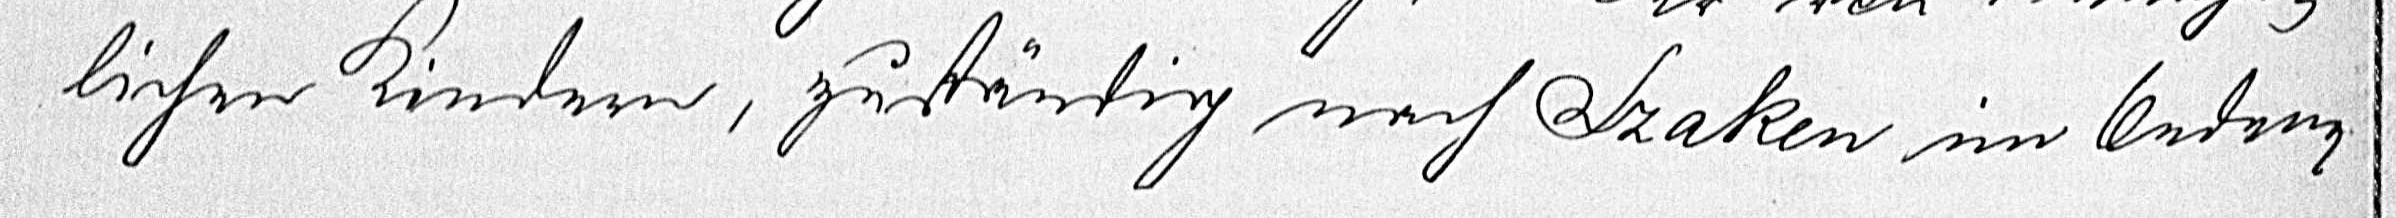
lichen Kindern, zuständig nach Szaken in Oeden¬
